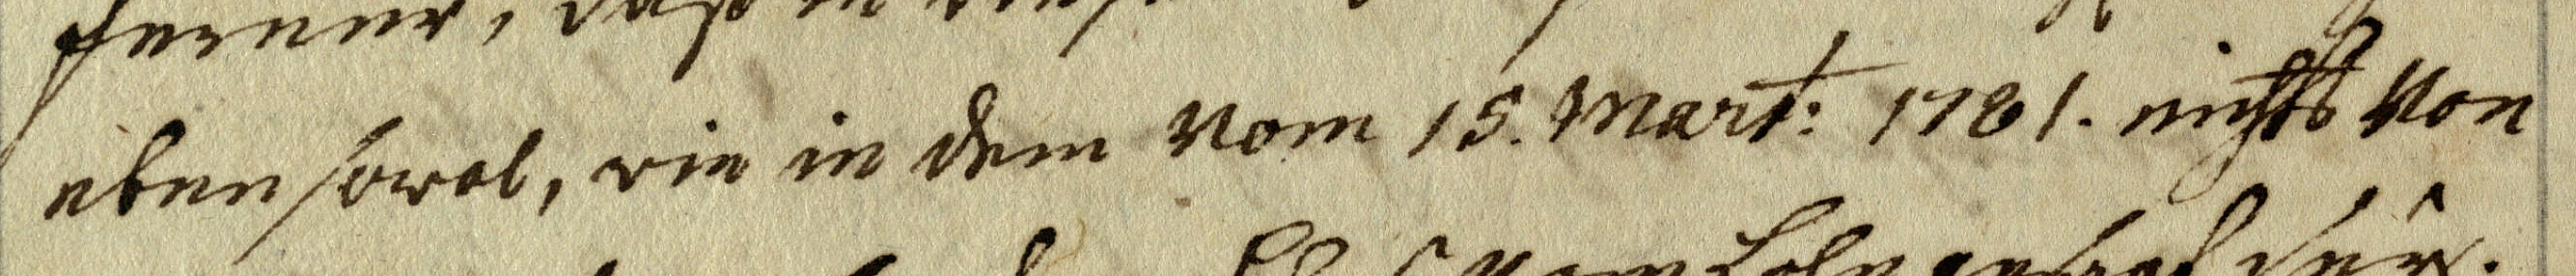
eben sowol, wie in dem vom 15. Mart. 1781. nichts von
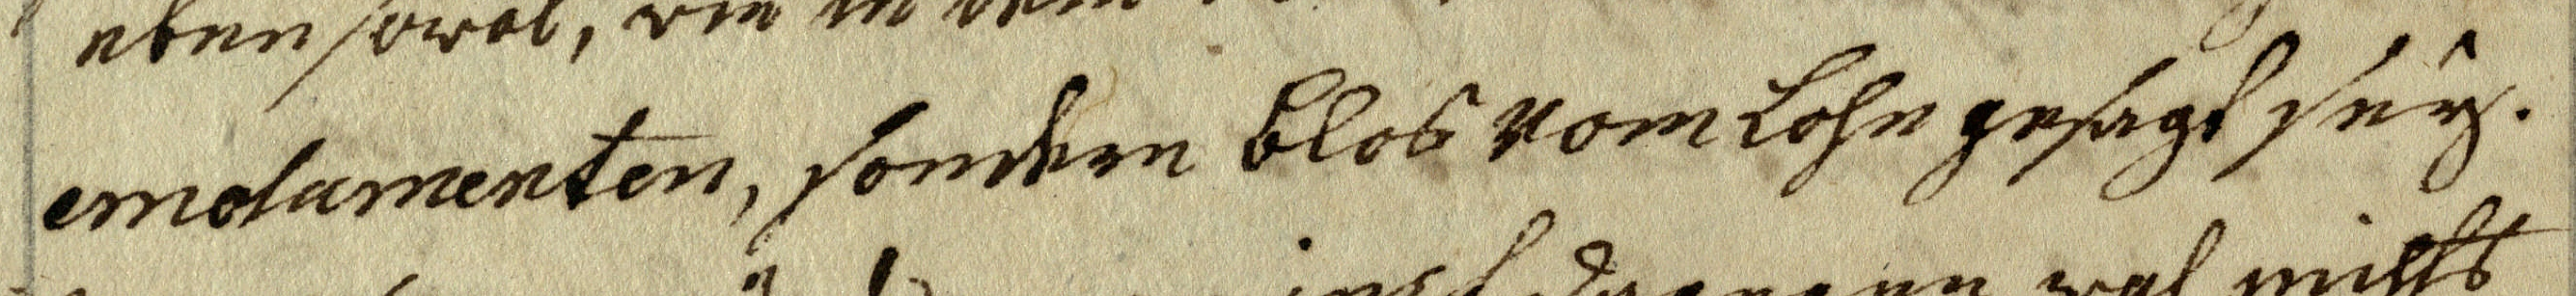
emolumenten, sondern blos vom Lohn gesagt seÿ.
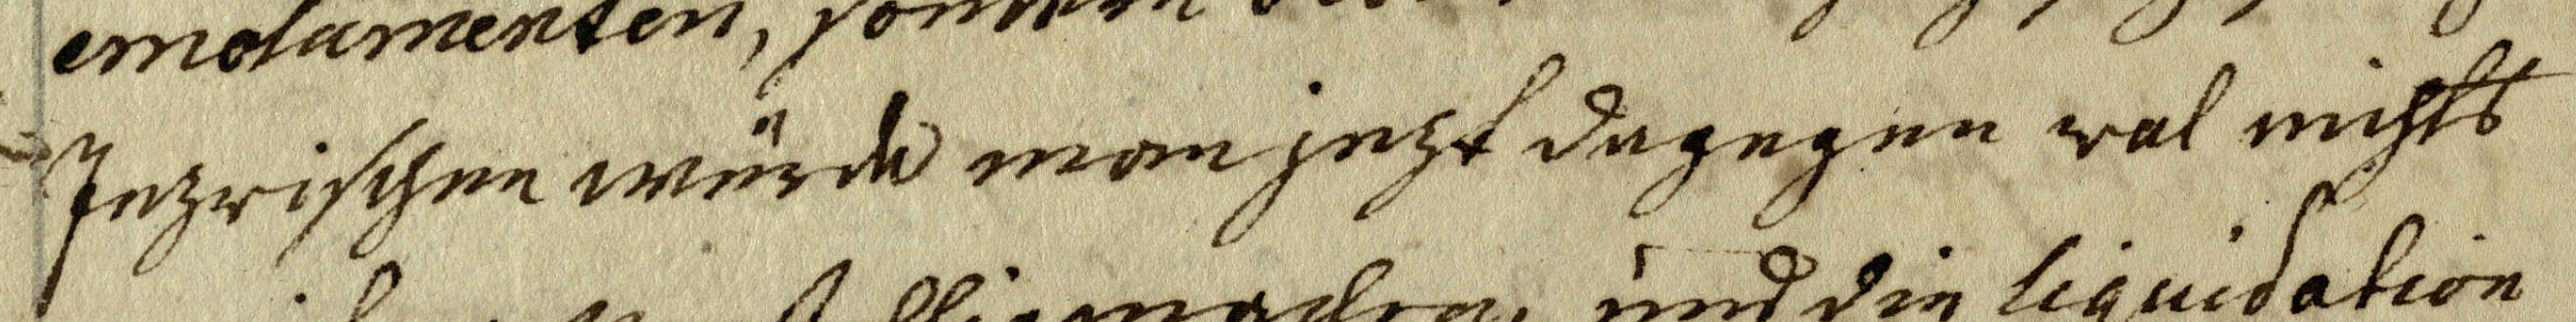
Inzwiscen würde man jetzt dagegen wol nichts
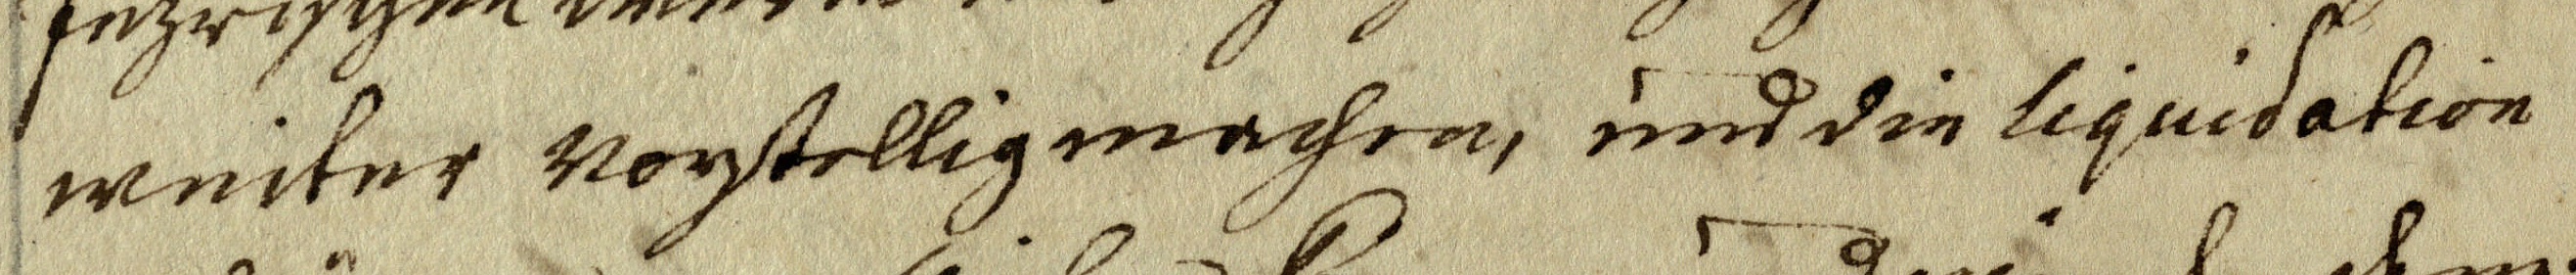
weiter vorstellig machen, und die liquidation
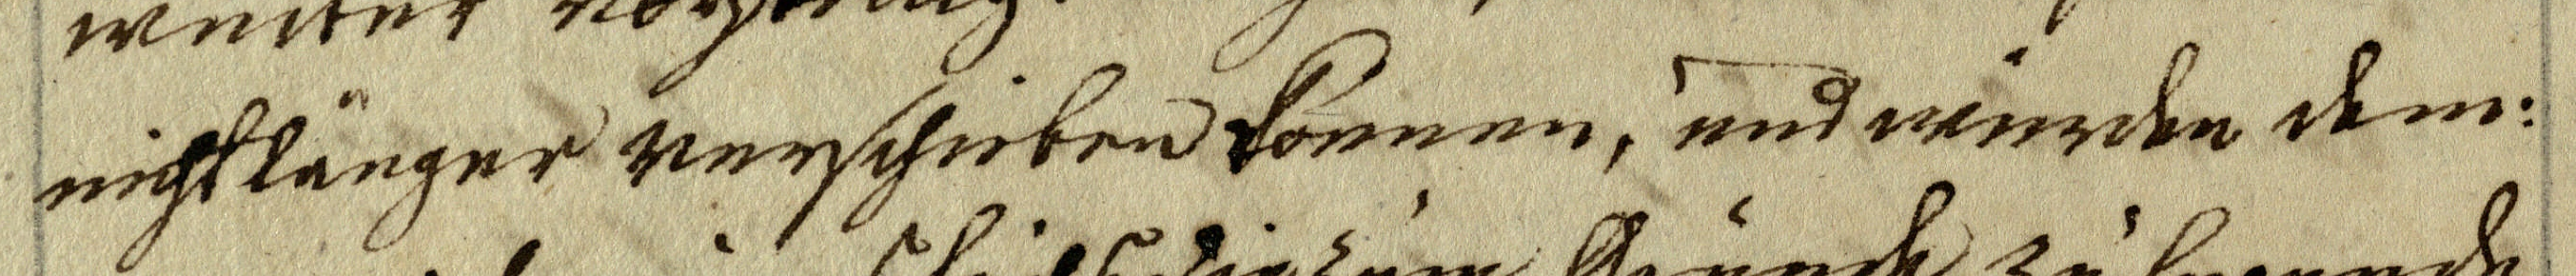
nicht länger verschieben können, und würden dem¬
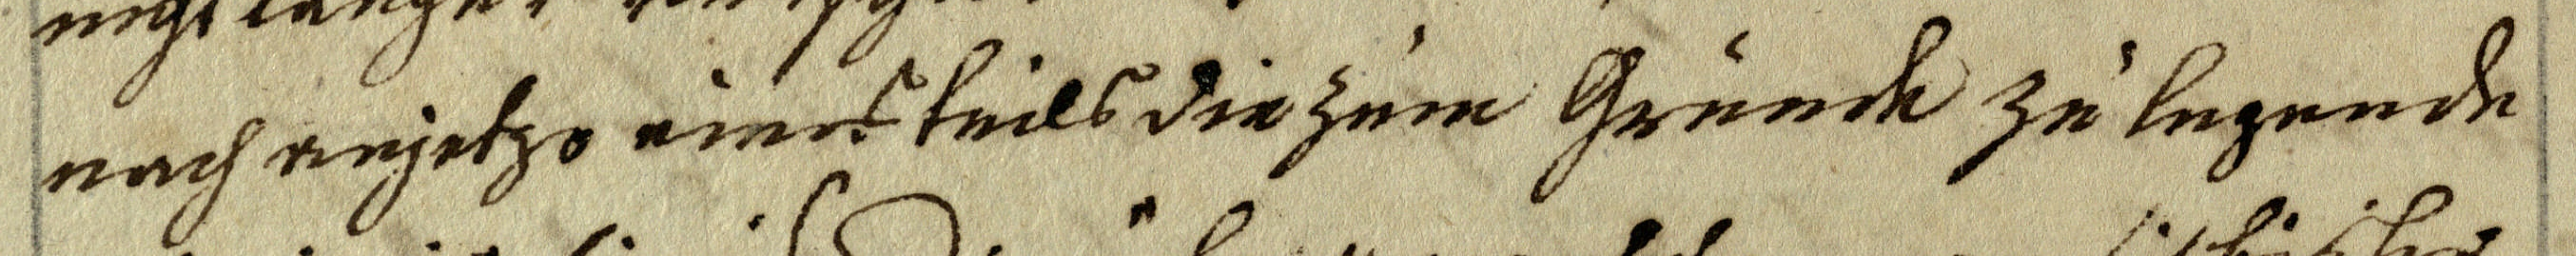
nach anjetzo eines theils die zum Grunde zu legende
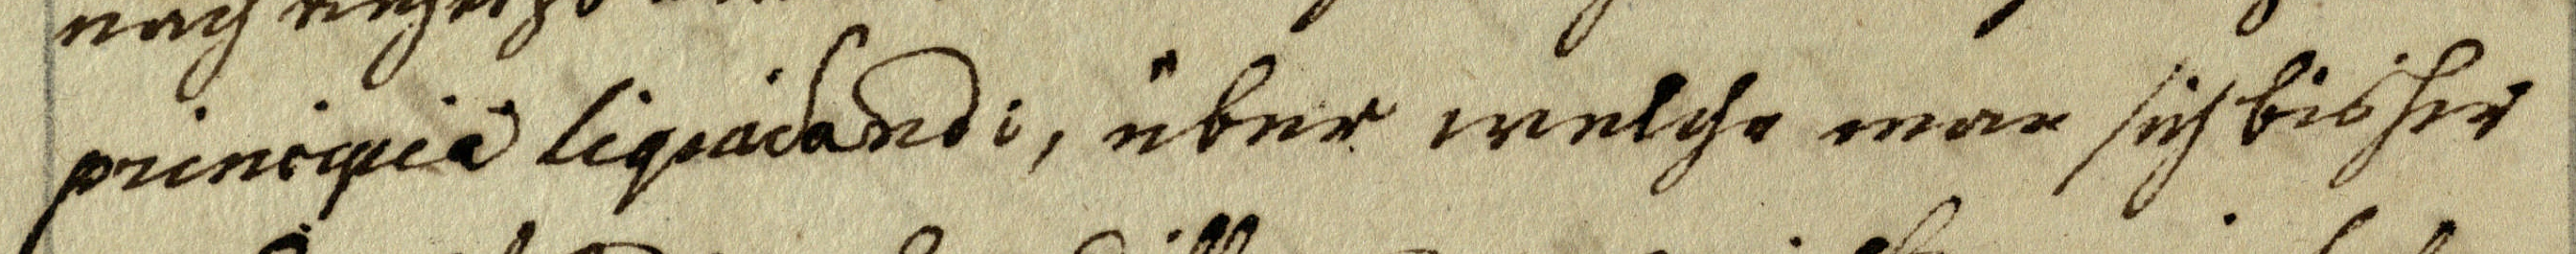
principia liquidandi, über welche man sich bisher
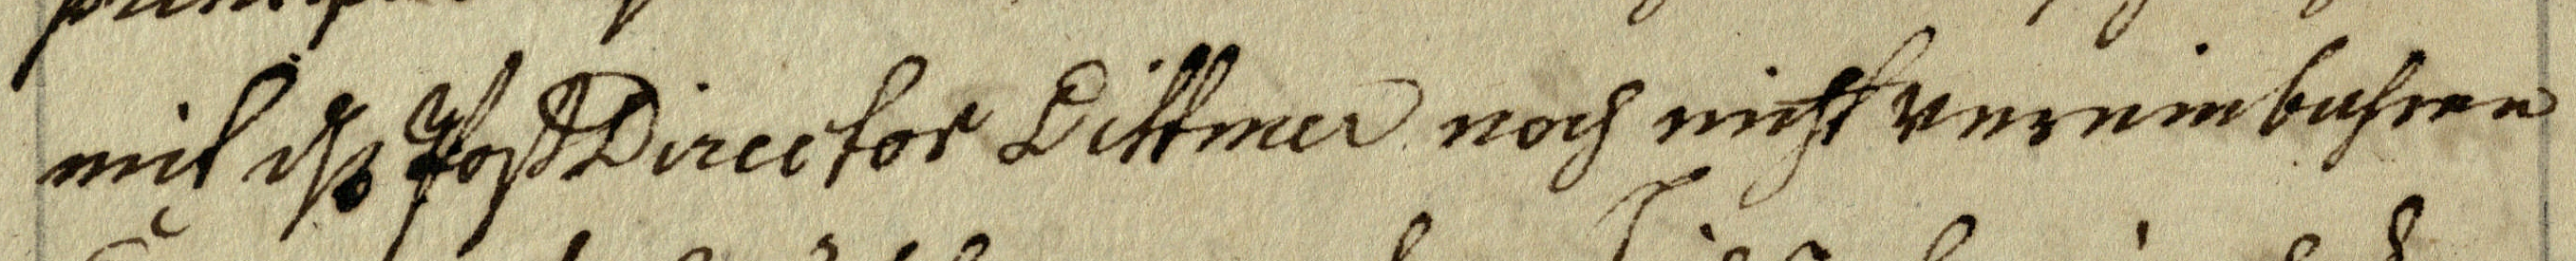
mit dh PostDirector Dittmer noch nicht vereinbahren
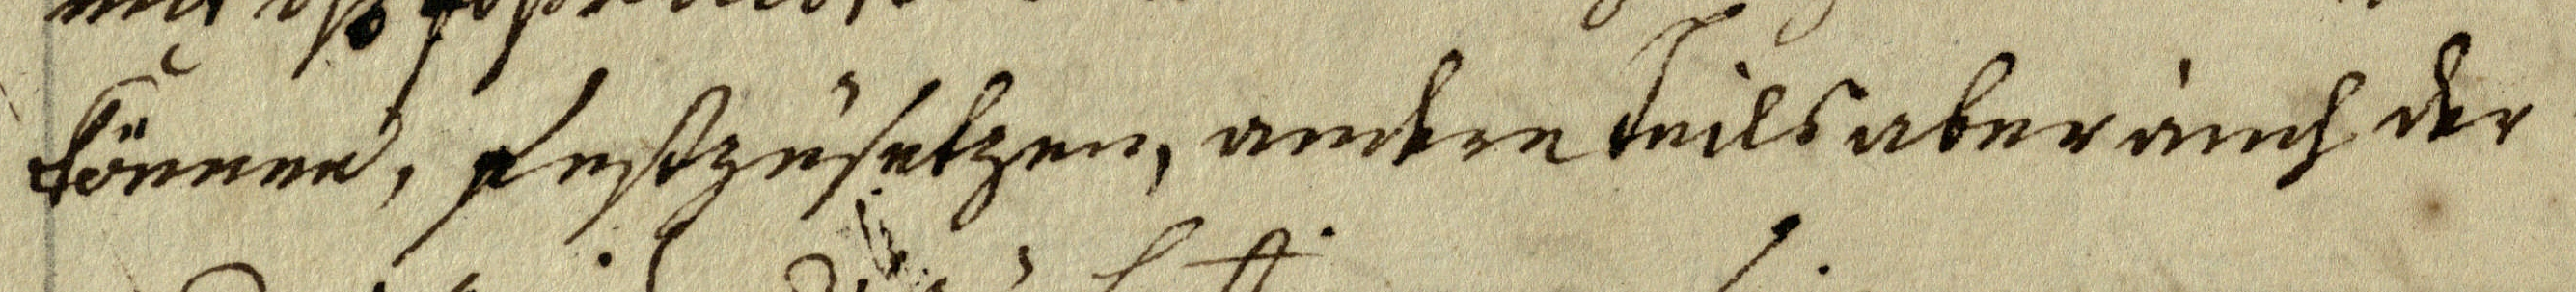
könne, festzusetzen, andern Teils aber auch der
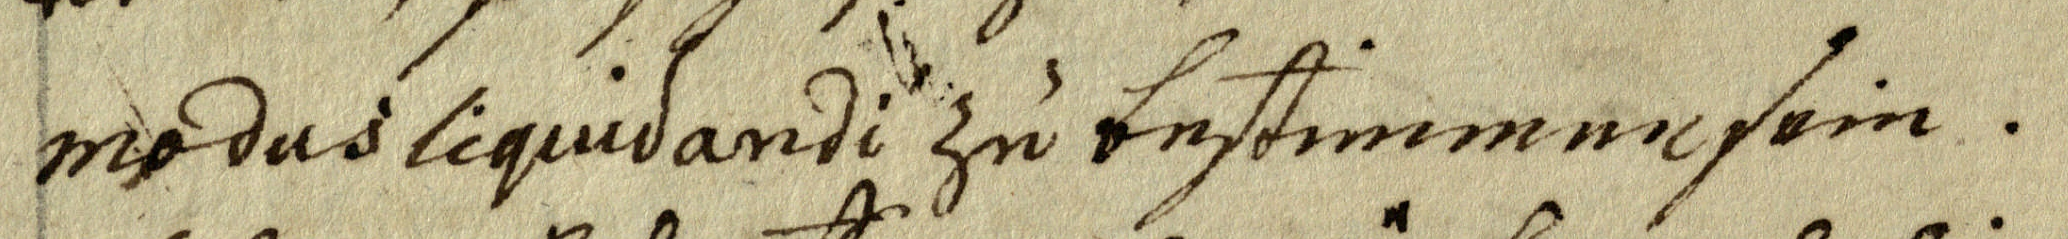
modus liquidandi zu bestimmen sein.
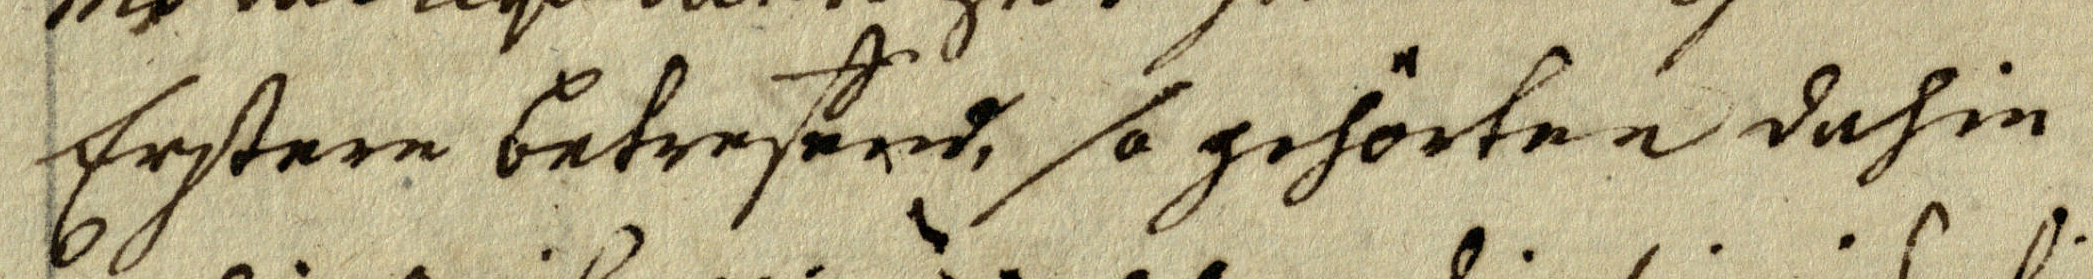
Erster betreffend, so gehörten dahin
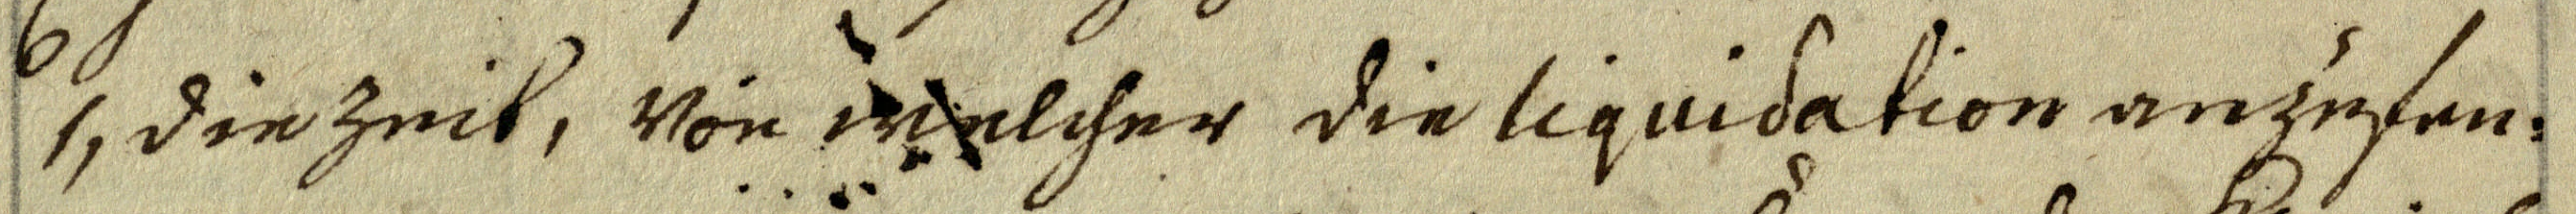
1, die Zeit, von welcher die liquidation anzufan¬
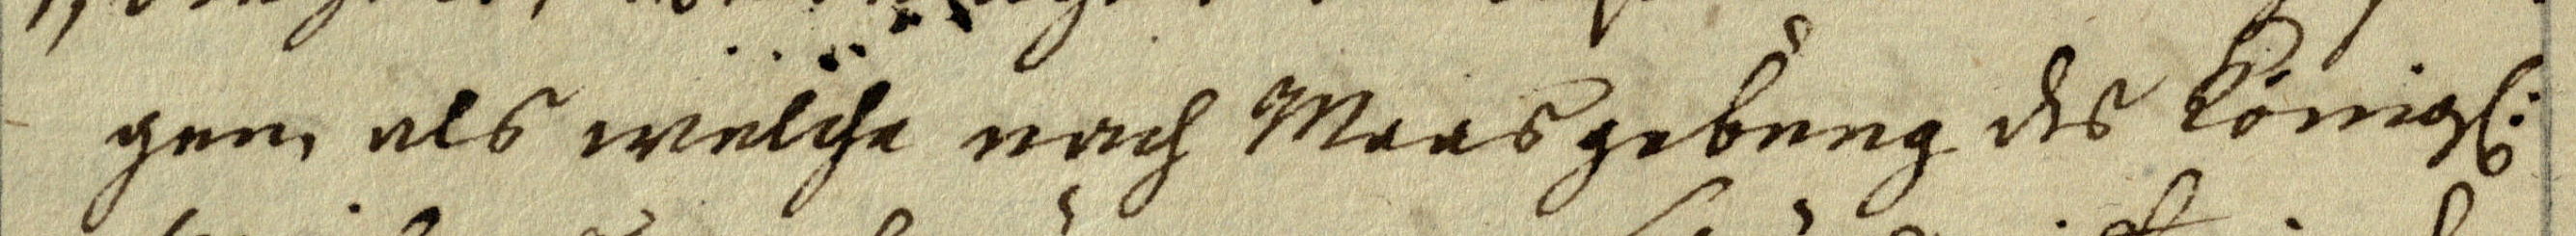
gen, als welche nach Maasgebung des Königl.
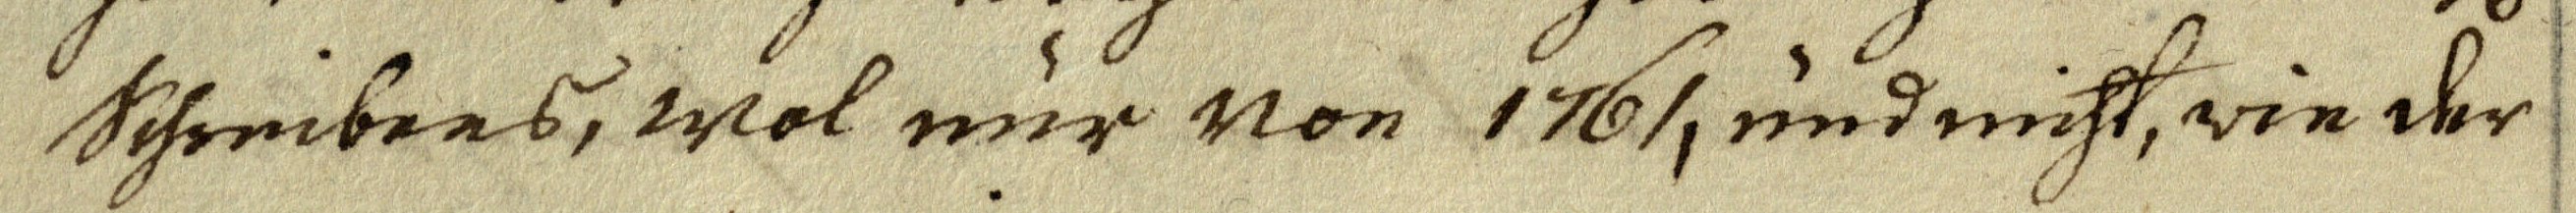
Schreibens, wol nur von 1761, und nicht, wie der
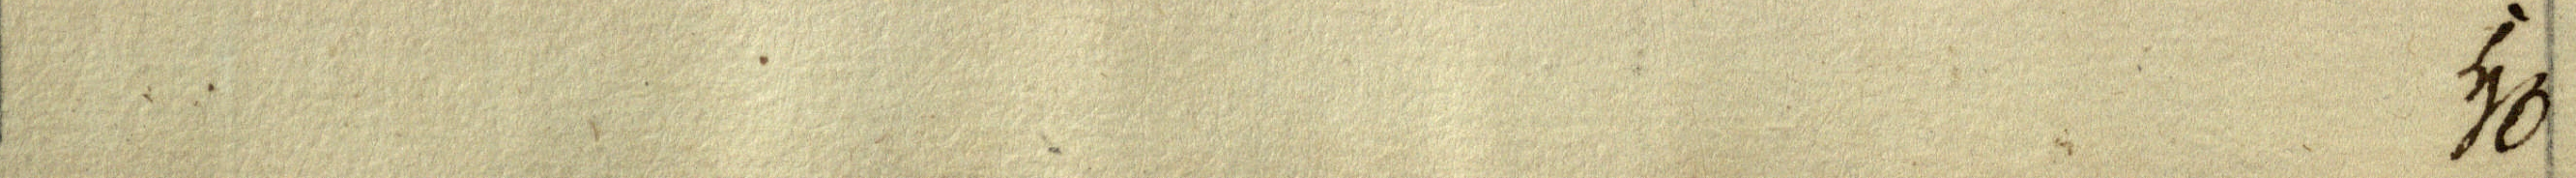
H.
